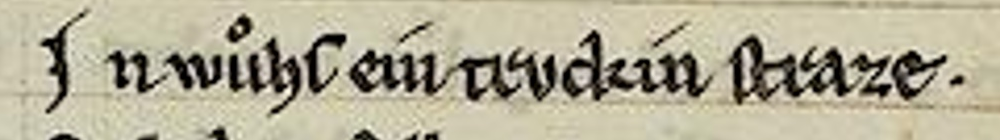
In wu°ohſ ein trvckin ſtraze.
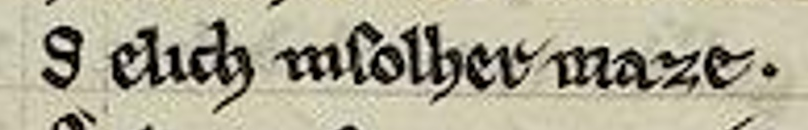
Selich inſolher maze.
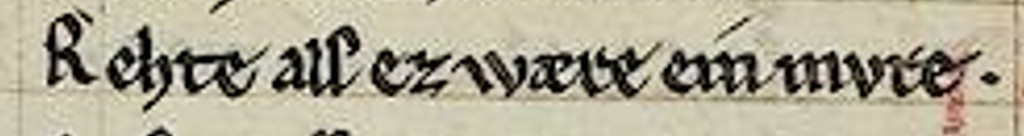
Rehte alſ ez w[ae]re ein mvre.
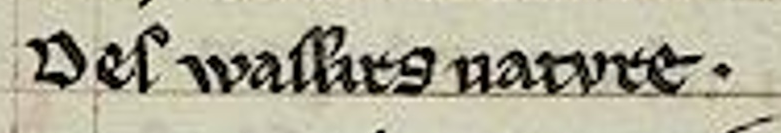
Deſ waſſirs natvre.
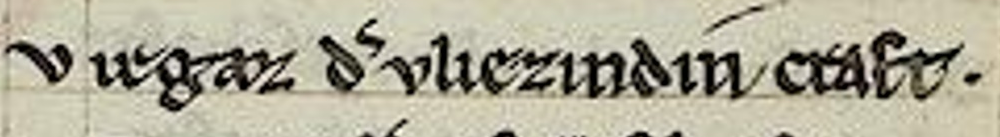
Virgaz d(er) vliezindin craft.
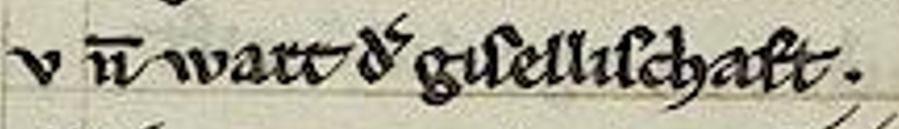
Vn(d) wart d(er) giſelliſchaft.
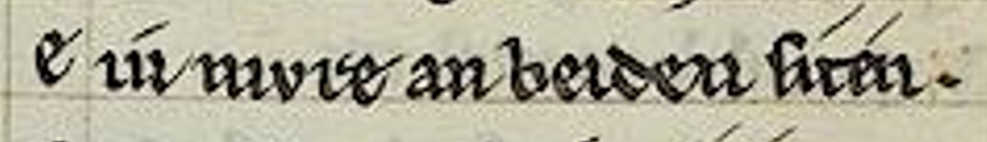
Ein mvre an beiden ſiten.
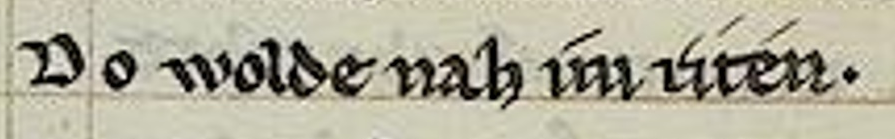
Do wolde nah im riten.
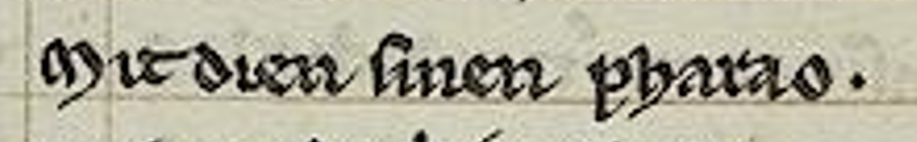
Mit dien ſinen pharao.
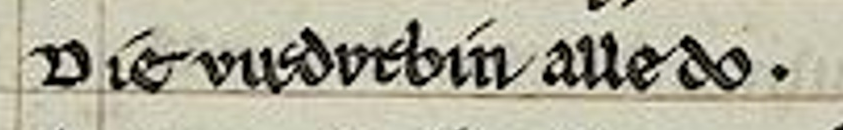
Die virdvrbin alle do.
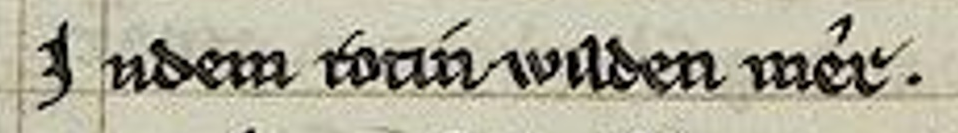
Indem rotin wilden mer.
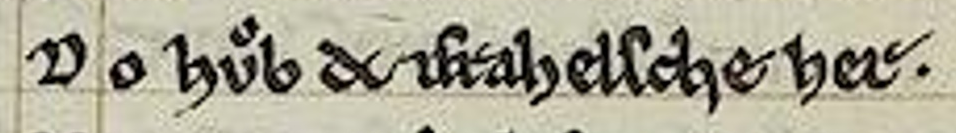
Do hv°ob d(az) iſrahelſche her.
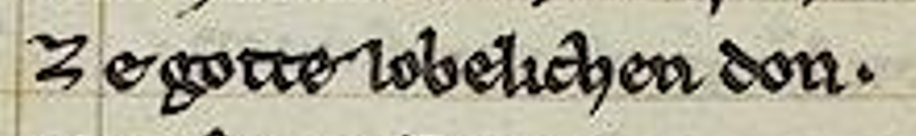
Ze gotte lobelichen don.
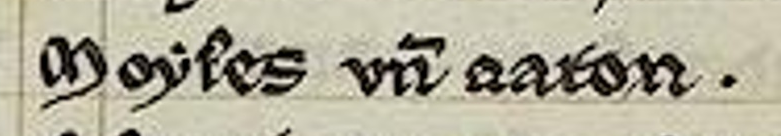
Moyſes vn(d) aaron.
